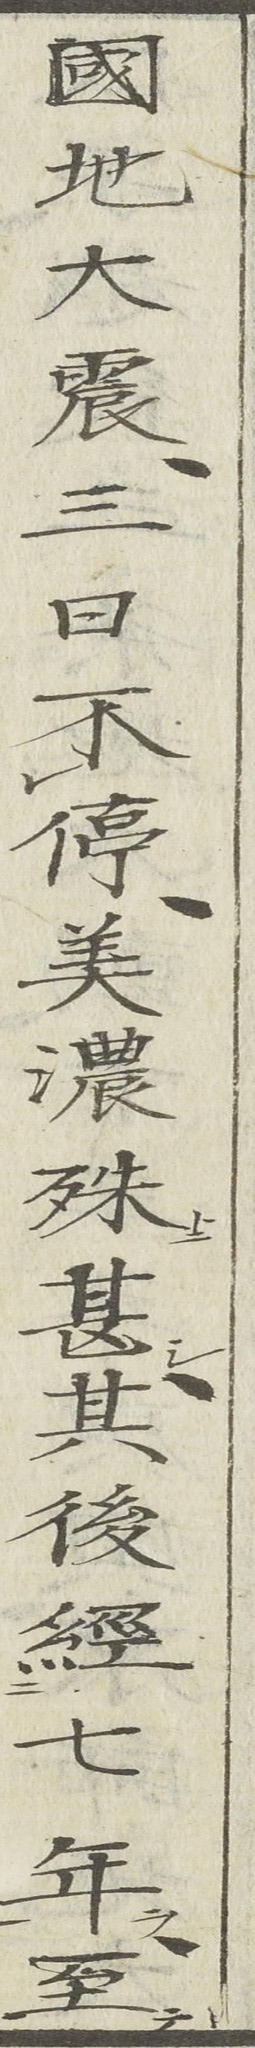国地大震、三日不停、美濃殊甚、其後経七年、至
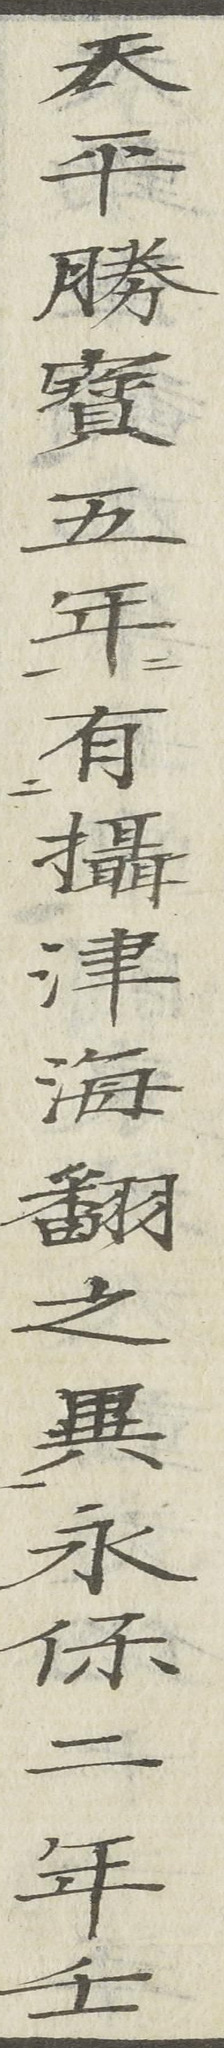天平勝宝五年有摂津海翻之異永保二年壬
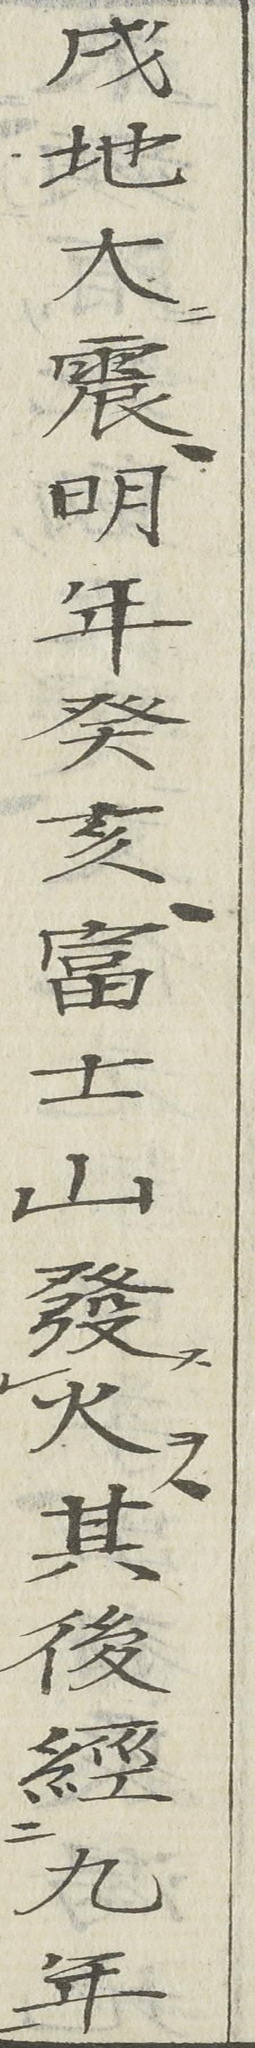戌地大震、明年癸亥、富士山発火、其後経九年
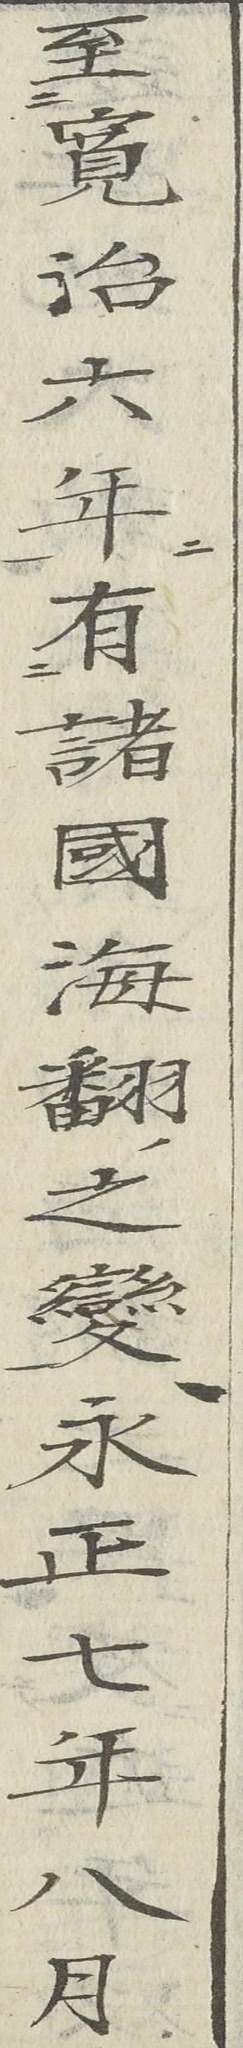至寛治六年有諸国海翻之変、永正七年八月

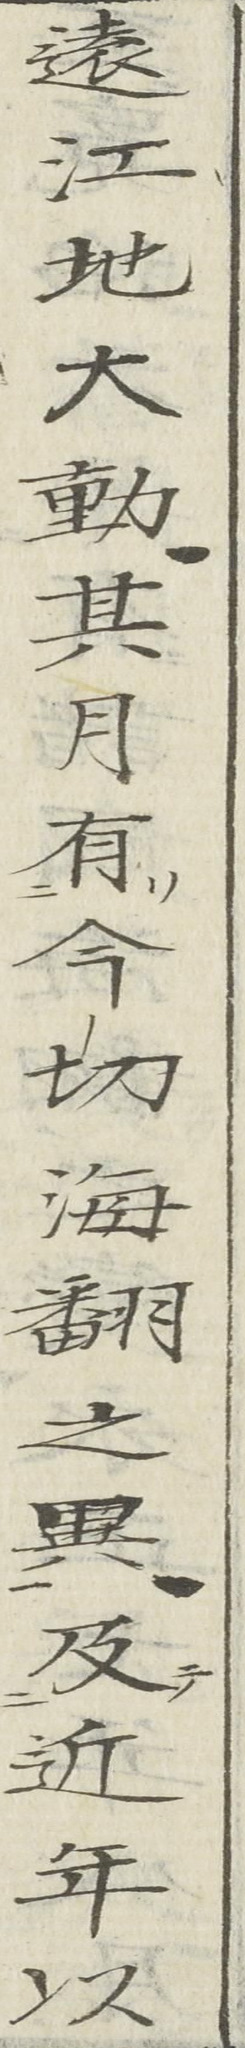遠江地大動、其月有今切海翻之異、及近年以
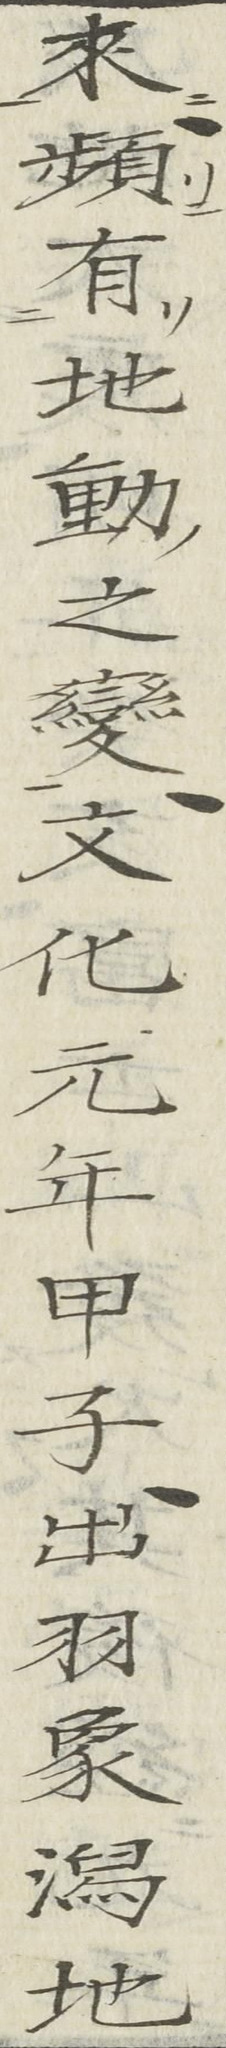來、頻有地動之変、文化元年甲子、出羽象潟地
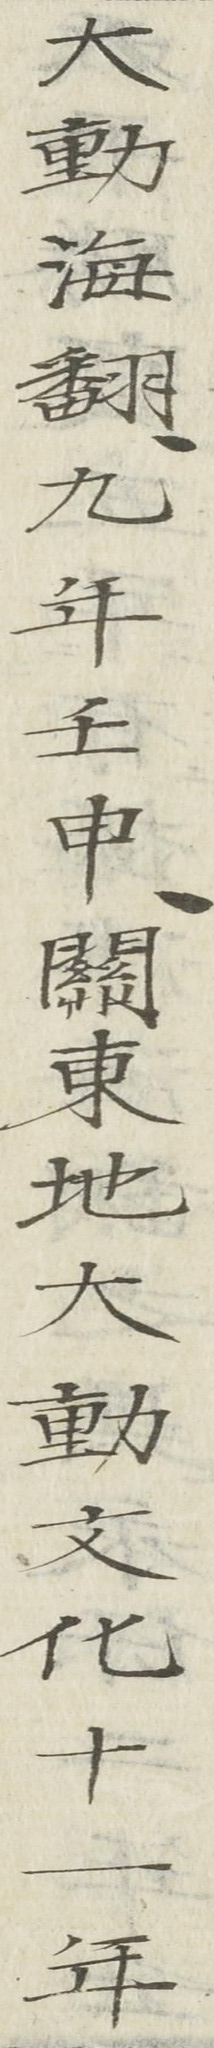大動海翻、九年壬申、関東地大動文化十一年
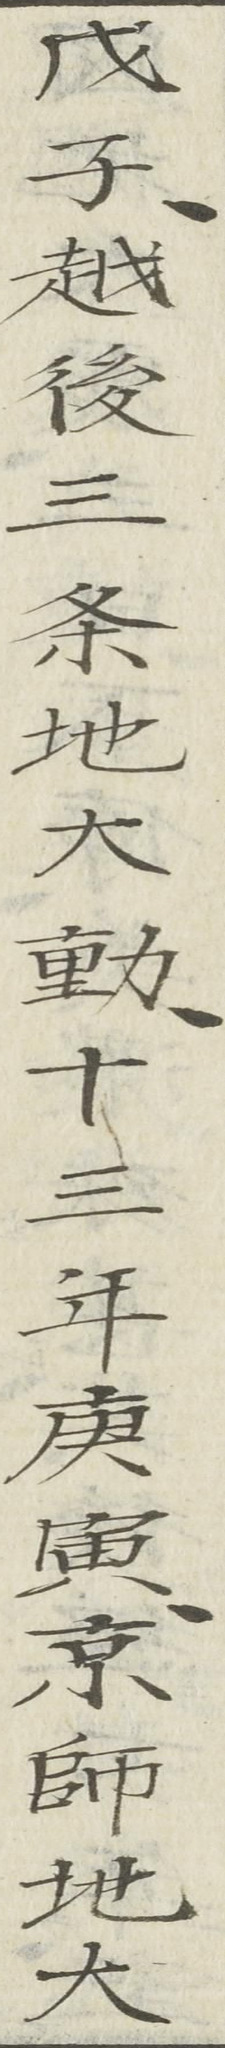戊子、越後三条地大動、十三年庚寅、京師地大
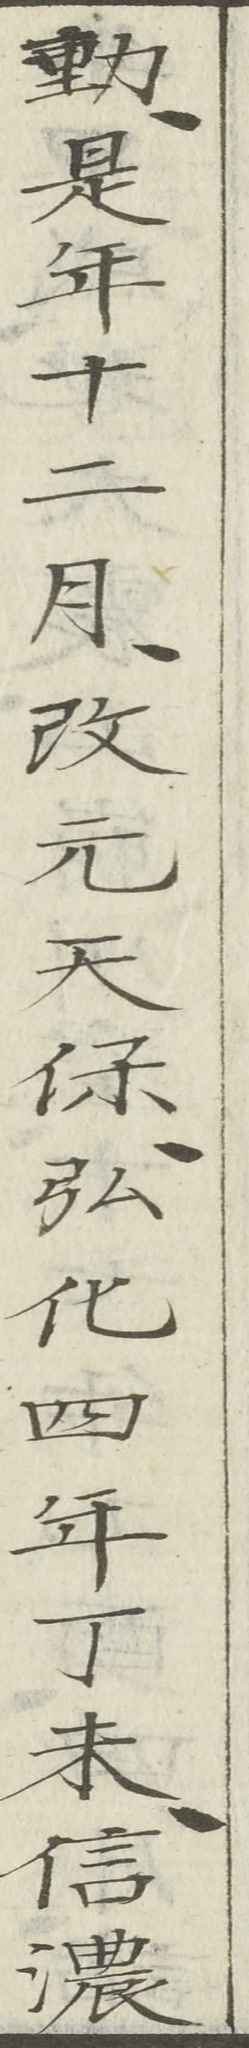動、是年十二月、改元天保、弘化四年丁未、信濃
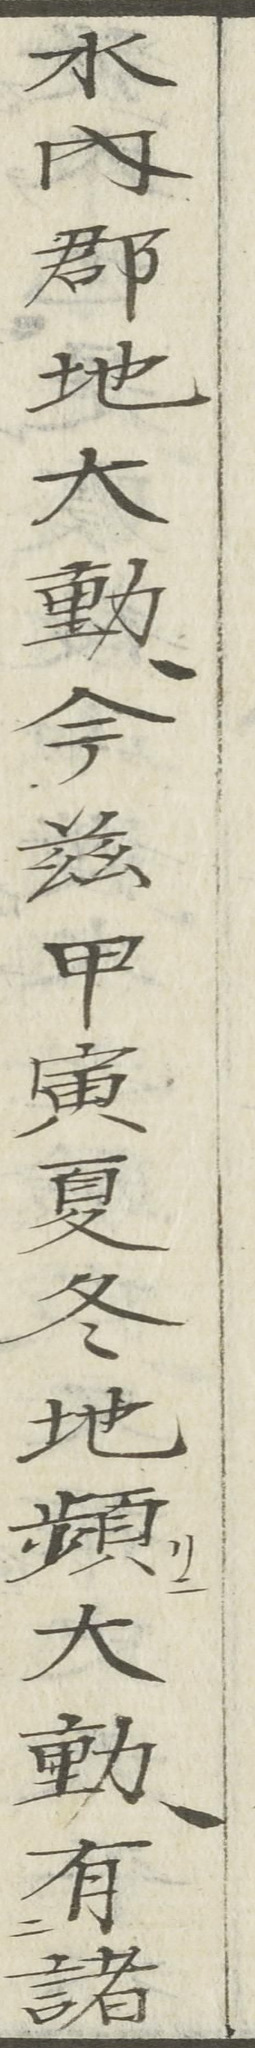水内郡地大動、今茲甲寅夏冬地頻大動、有諸
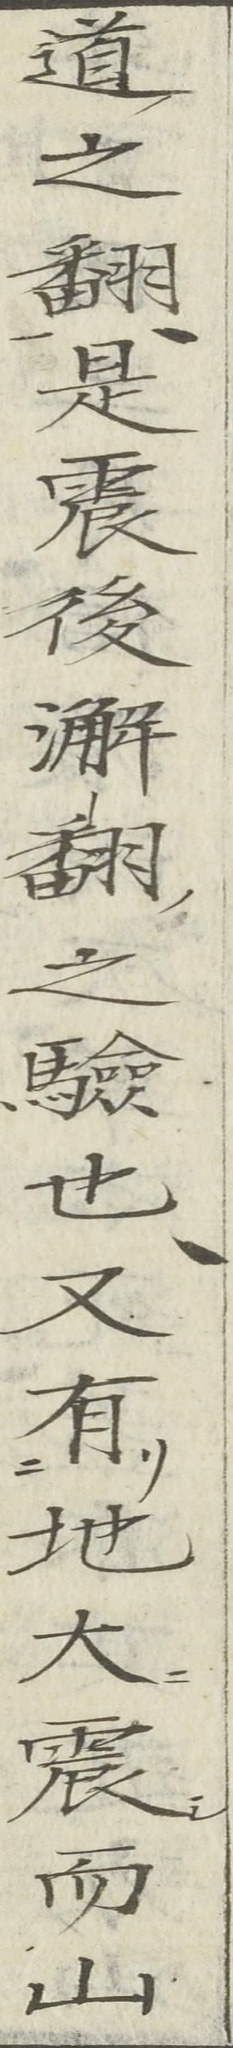道之翻、是震後澥翻之験也、又有地大震而山
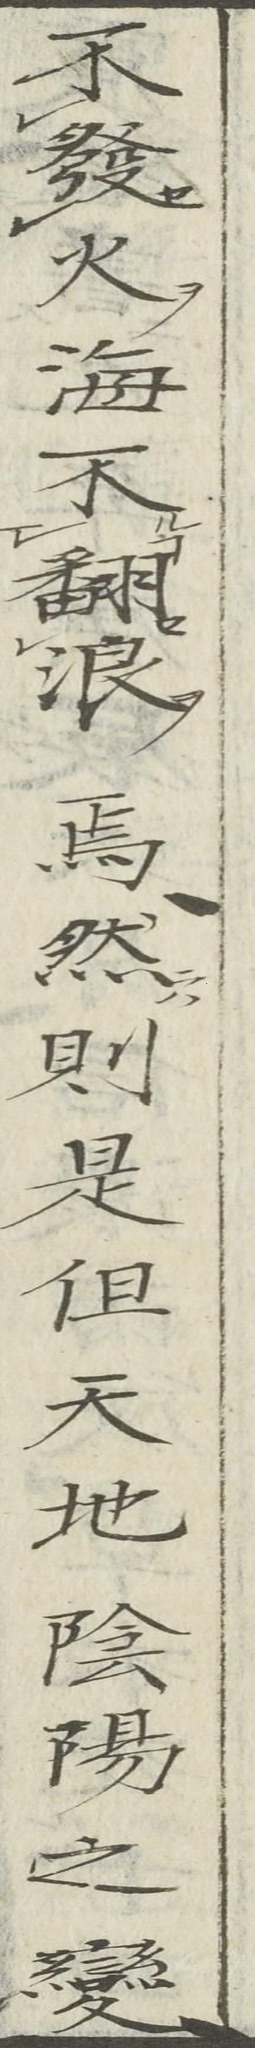不発火海不翻浪焉、然則是但天地陰陽之変、
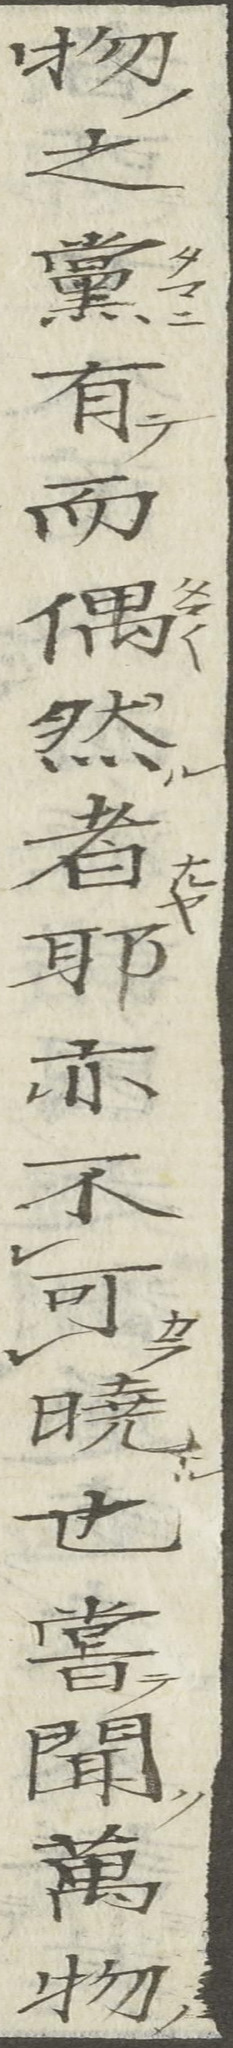物之党有而偶然者耶亦不可暁也嘗聞萬物
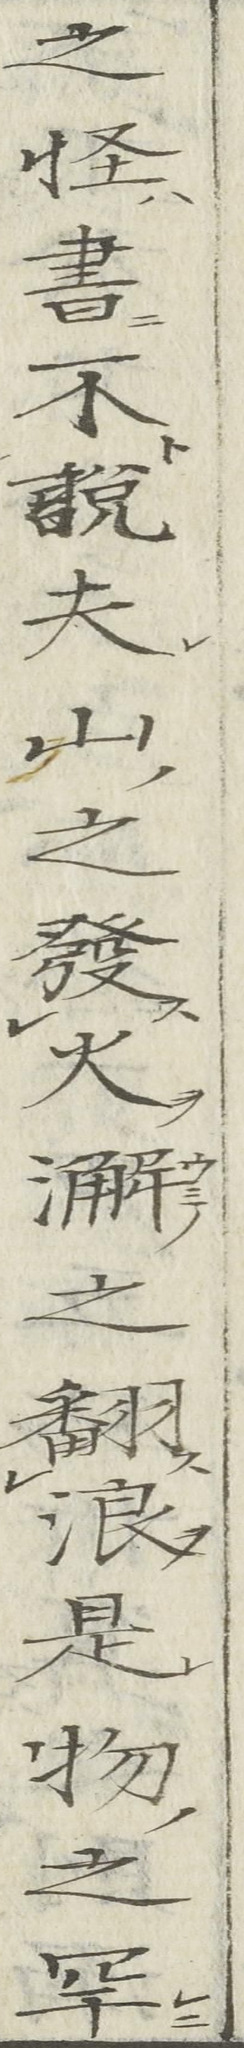之怪書不説夫山之発火澥之翻浪是物之罕
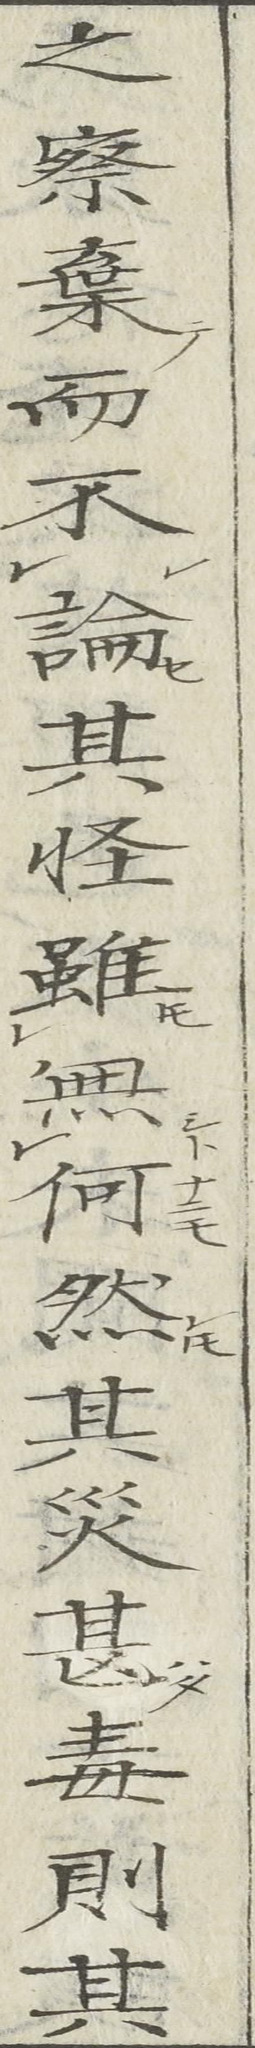之察棄而不論其怪雖無何然其災甚毒則其
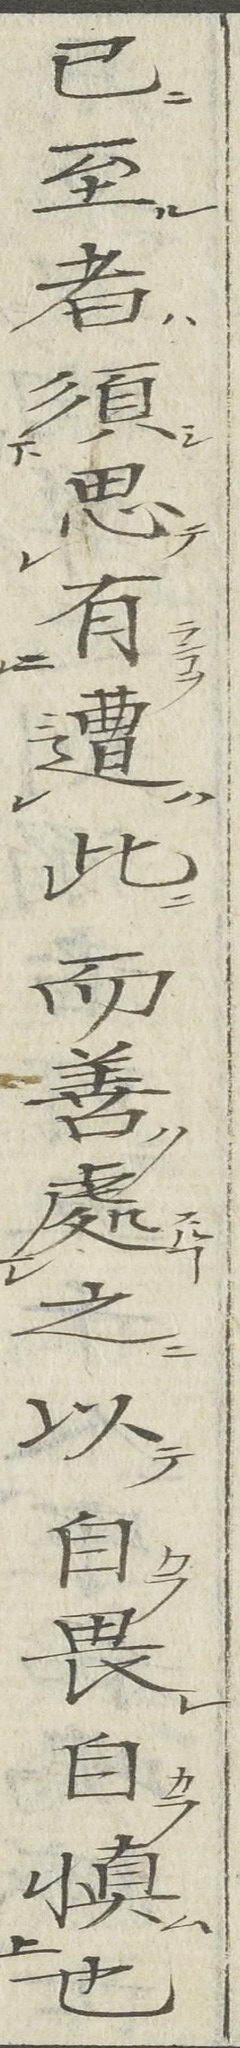已至者須思有遭此而善処之以自畏自慎也
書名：海翻考　全
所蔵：東京大学地震研究所図書室 Earthquake Research Institute Library, The University of Tokyo, JAPAN
